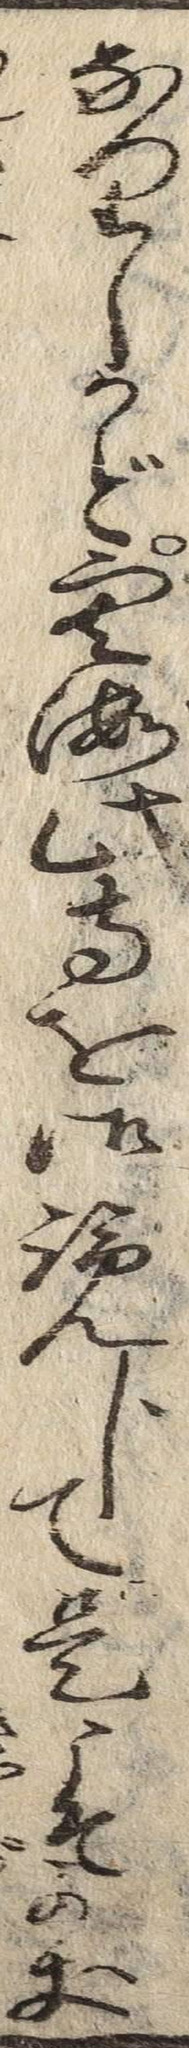なりしかど。空海此寺を御覧じて是こそかき
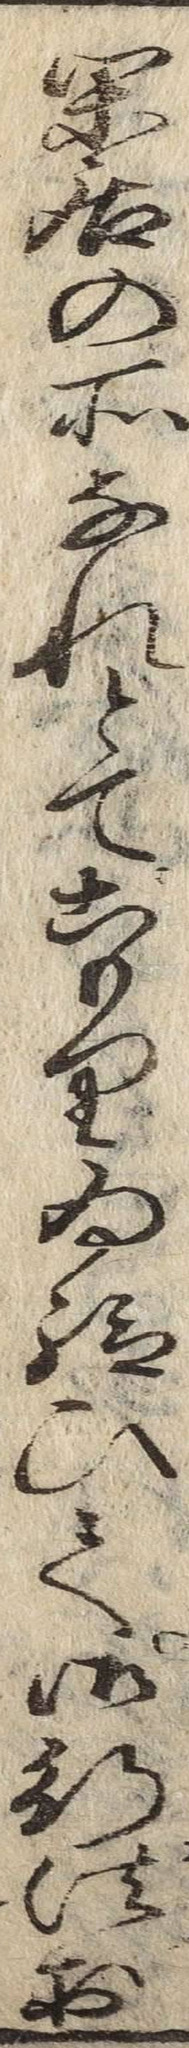閑居の所なれとてこもりゐ給ひて。御行法お
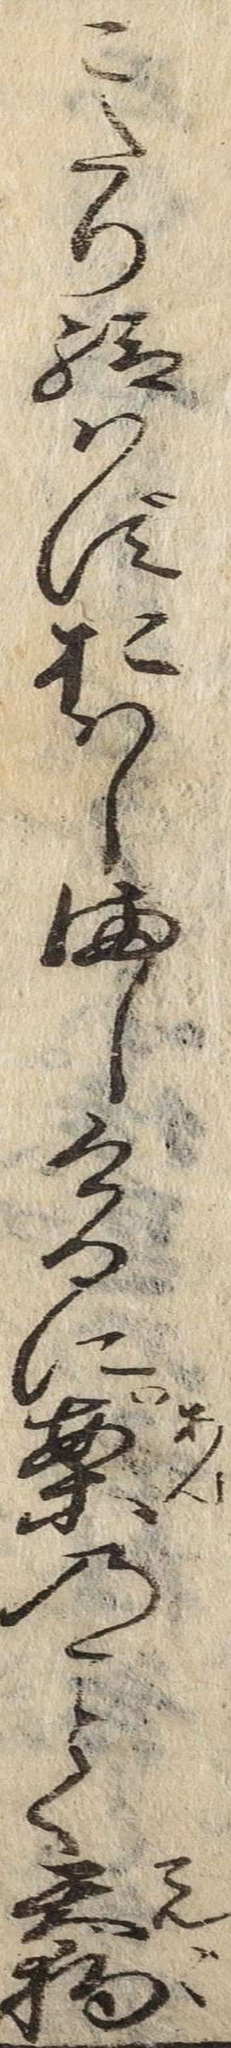こたり給はずおはしましけるに。案のことく天狗
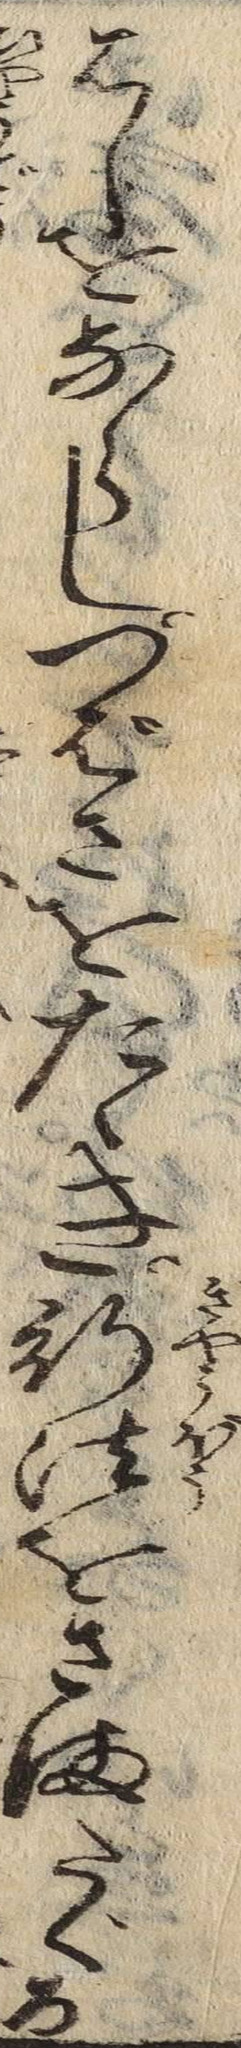はしをならし。つばさをたゝき行法をさまたぐる
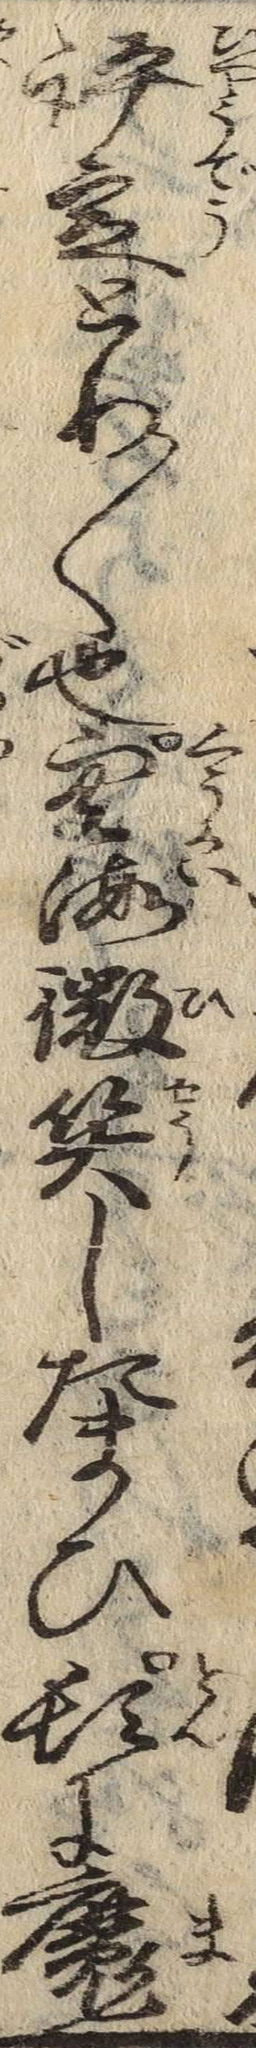評定とり〳〵也。空海微笑したまひ。頓に魔
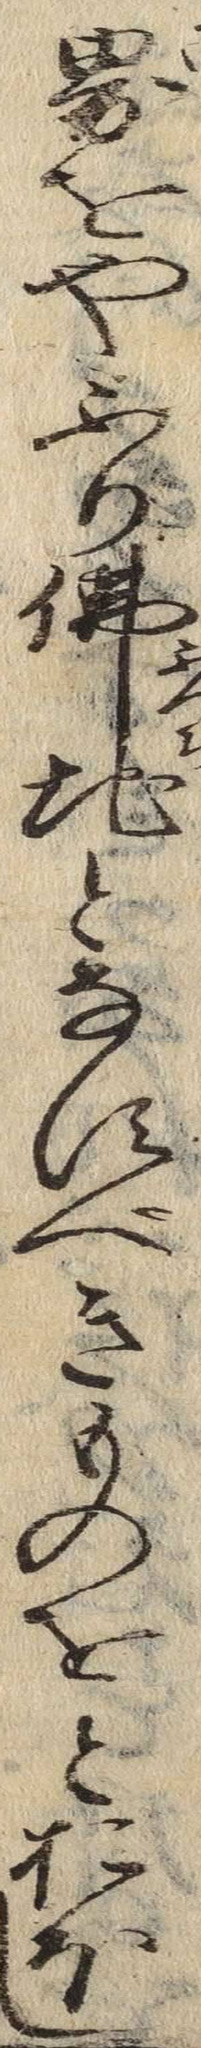界をやふり。仏地となすべきものをとおほし
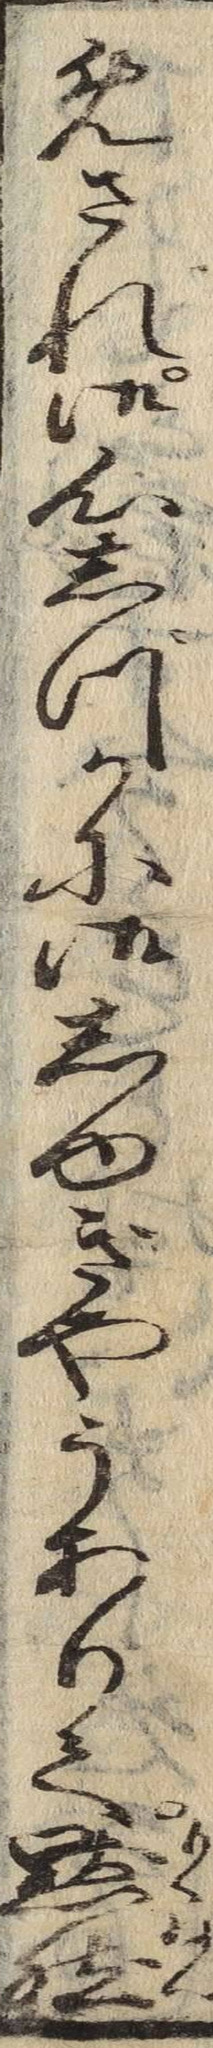めされ御こゝろしづかに御しゆぎやうありて黙然
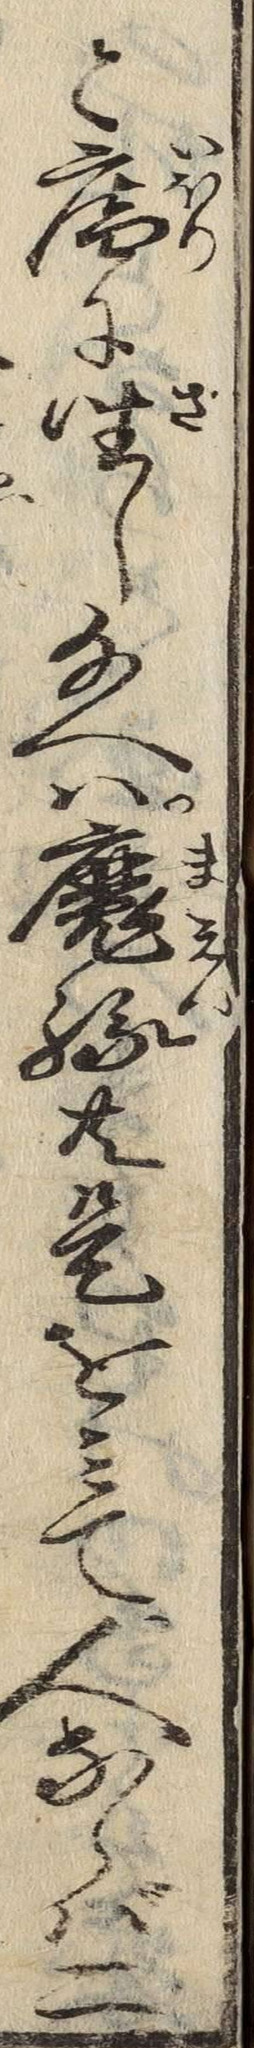と庵に座し給へは。魔縁共是をみて人ならば二
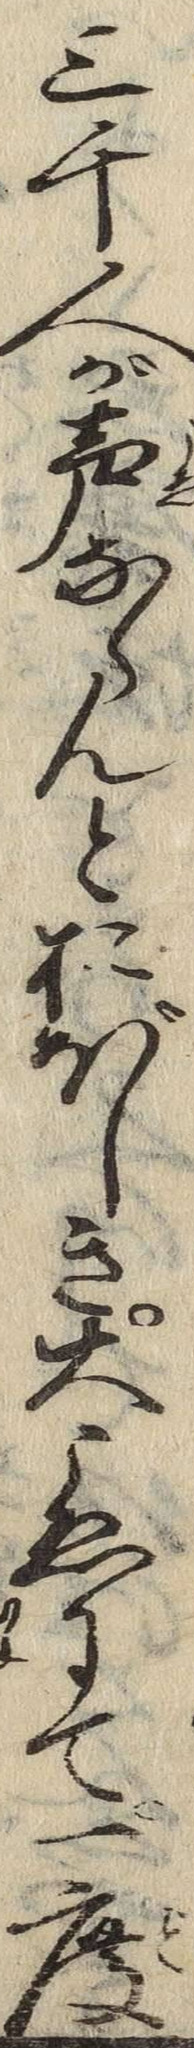三千人が声ならんとおぼしき。大こゑにて。一度
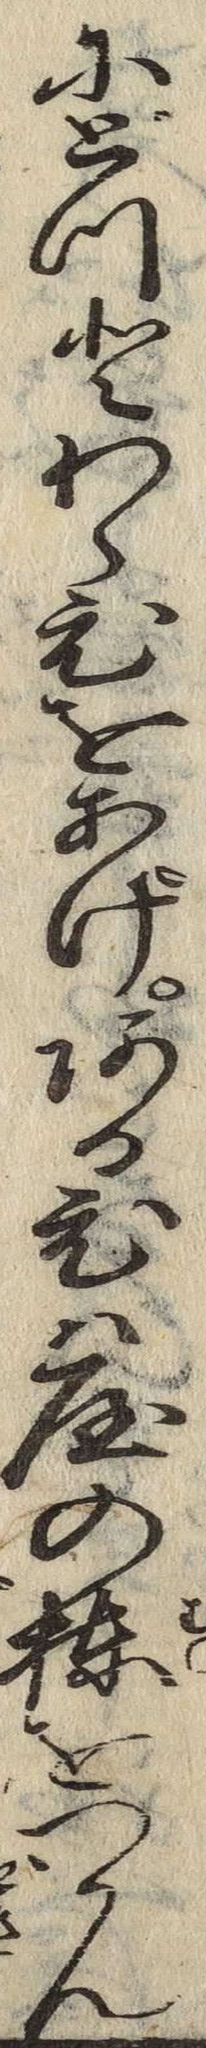にどつとわらひをあげ。あるひは屋の棟をつかん
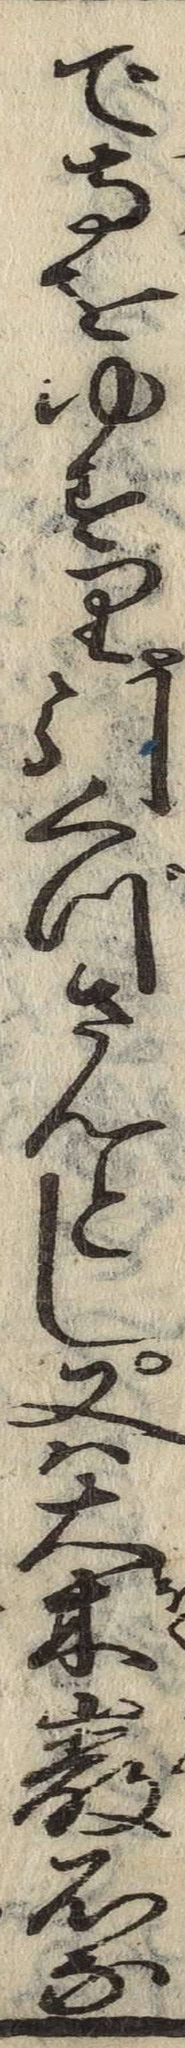で寺をゆすり。引くづさんとし。又は大木巌石な
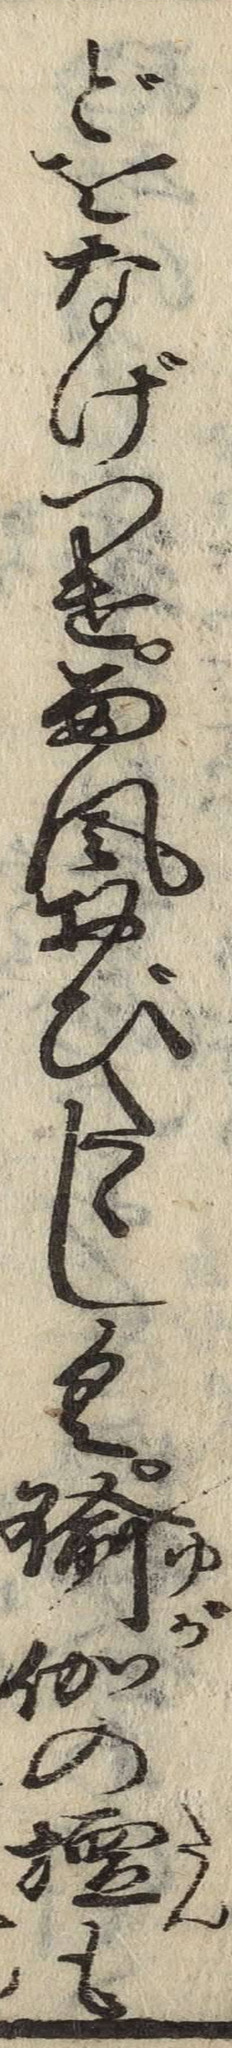どをなげつけ。西風おびたゝしく。瑜伽の壇も
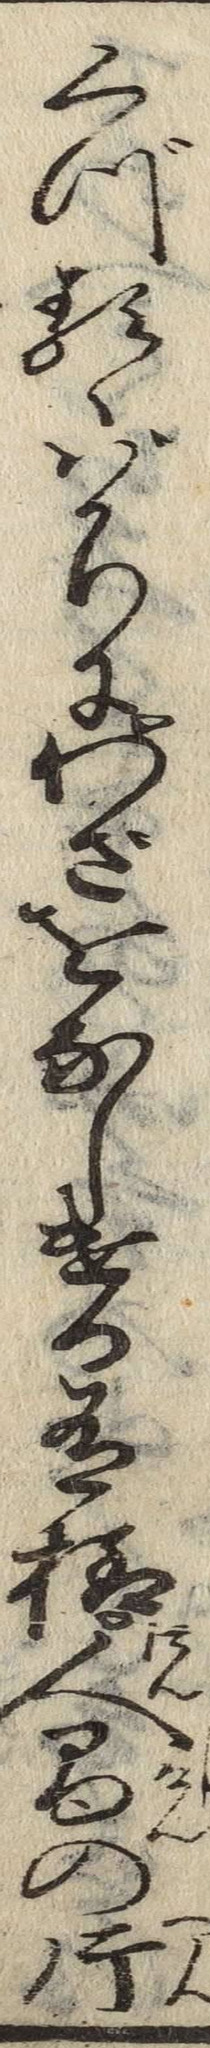くづるゝばかりに。わざをなしける有様。人間の片
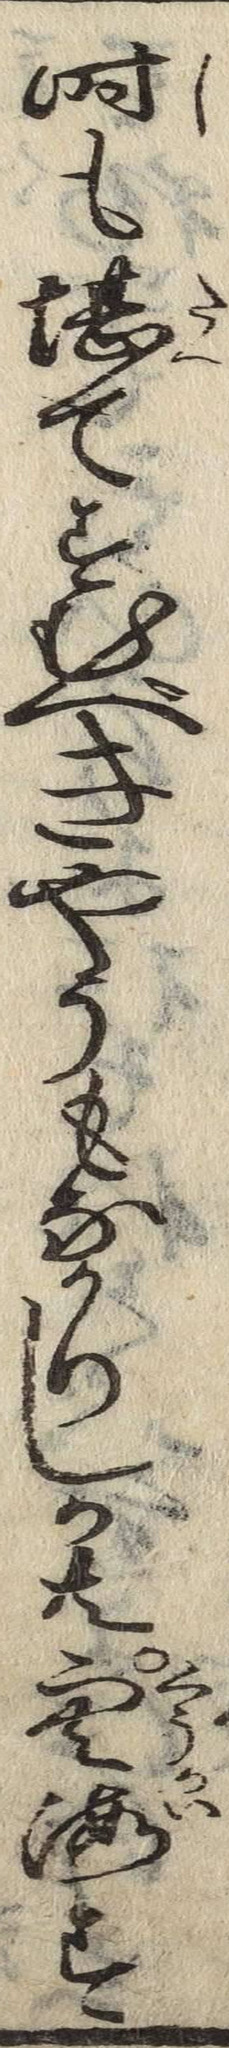時も堪てすむべきやうもなかりしか共。空海す
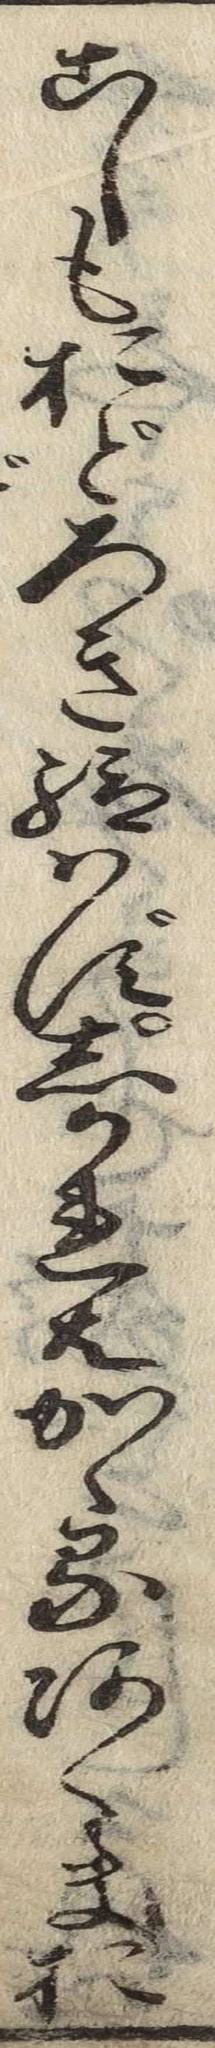こしもおどろき給はず。しかれ共化かるあくまお
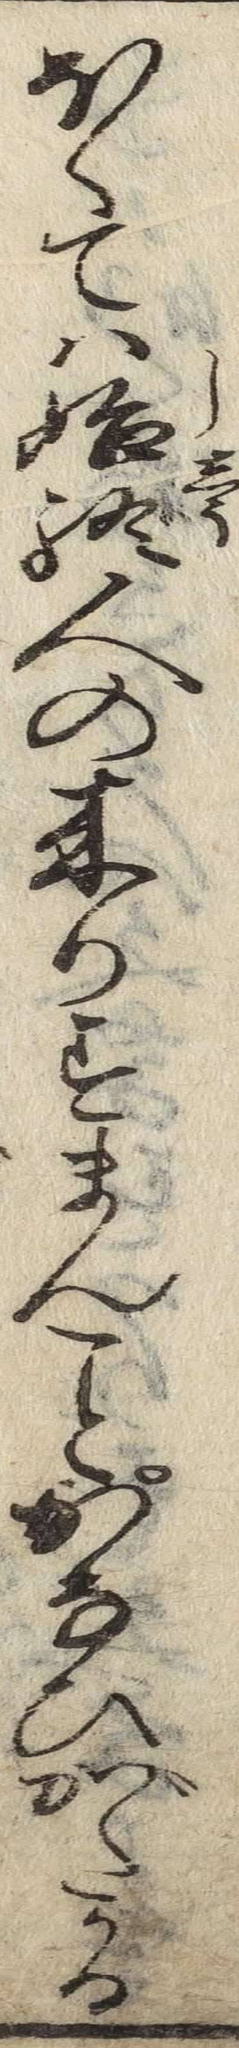ほくては始終人の来りすまんこと。かなひがたかる
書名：弘法大師御傳記
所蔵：京都府立京都学・歴彩館 国文学研究資料館
